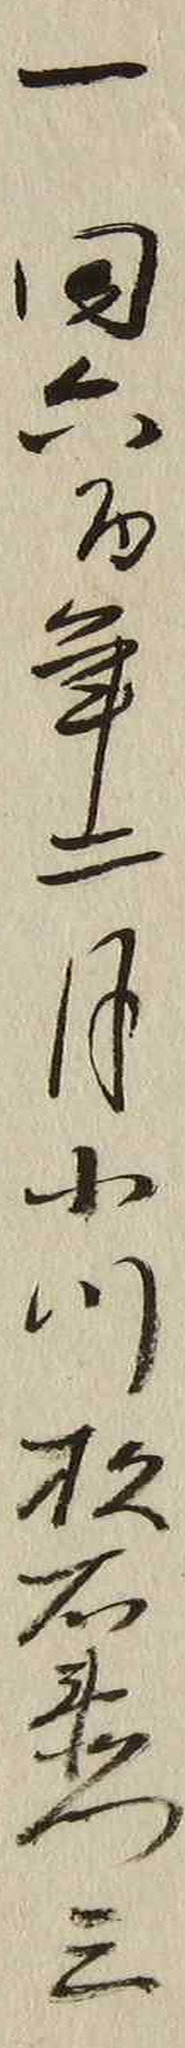一同六酉年二月小川杉右衛門三
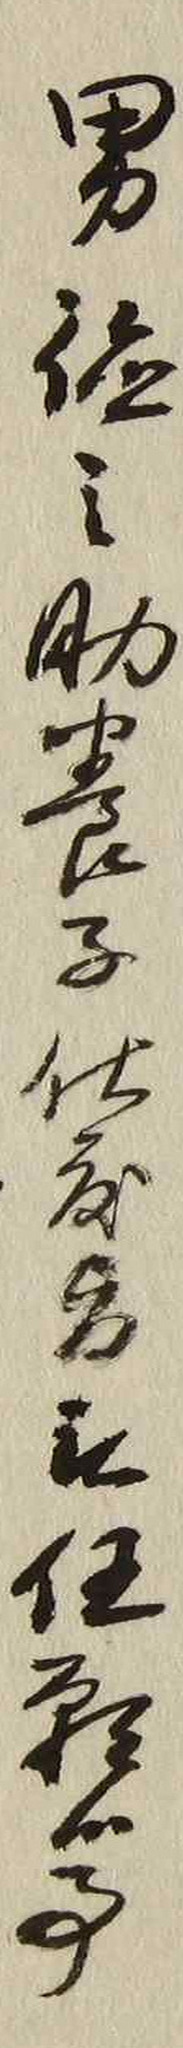男徳之助養子仕度旨被任願候事
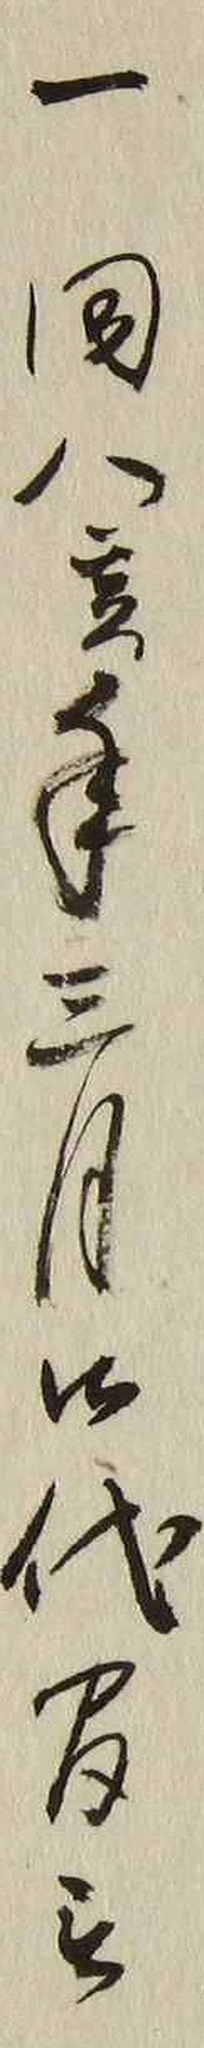一同八亥年三月御代官被
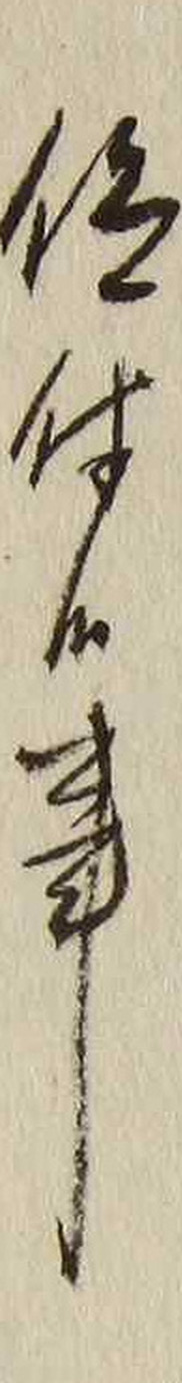仰付候事
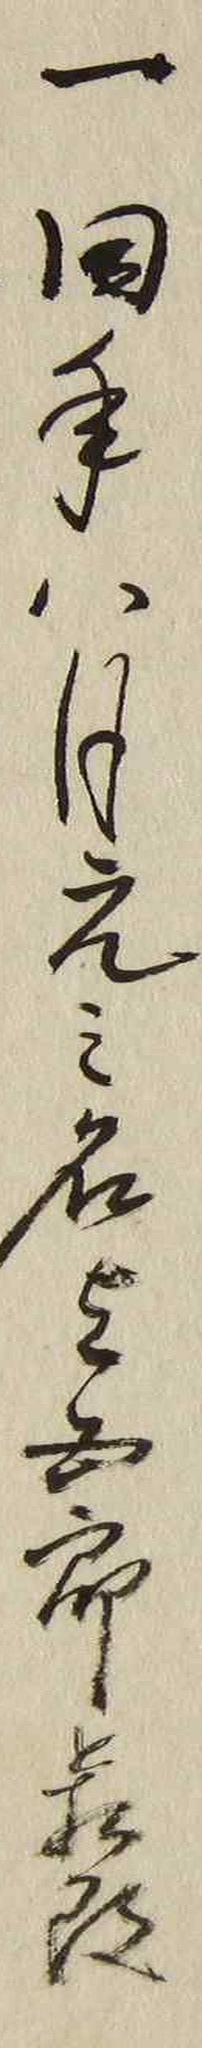一同年八月元之名与五郎と相改
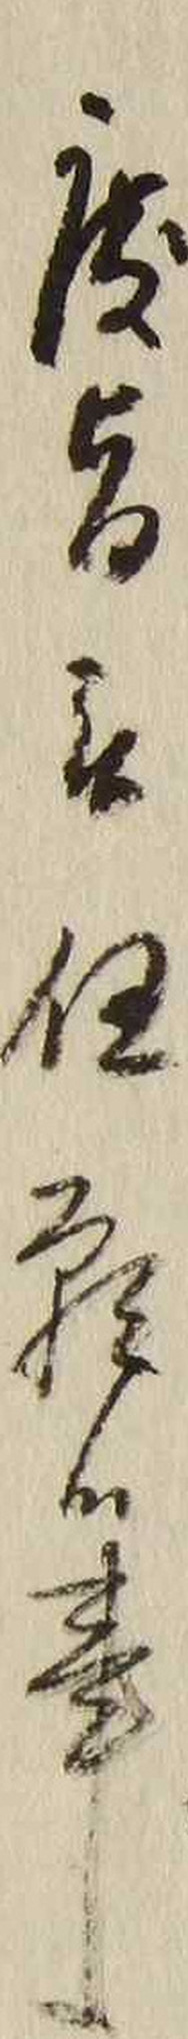度旨被任願候事

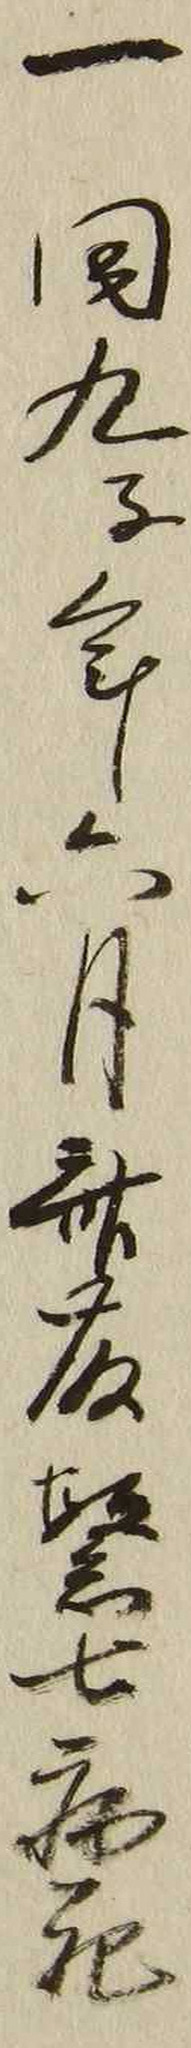一同九子年六月斎藤繁七病死
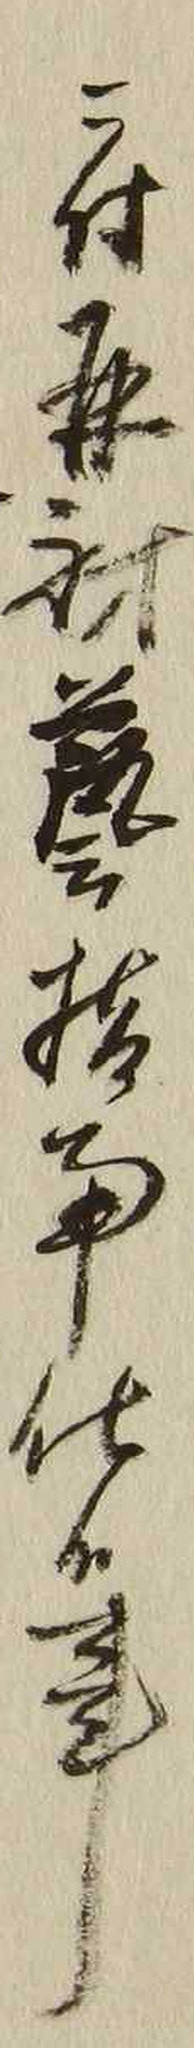ニ付再射芸指南仕候事
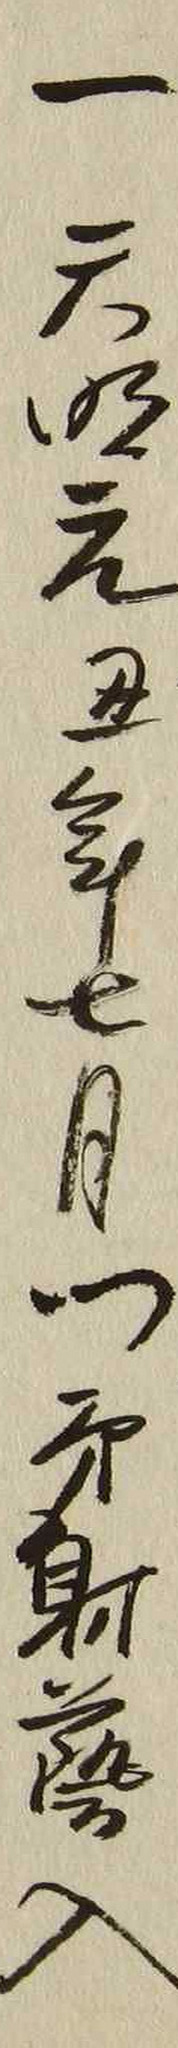一天明元丑年七月門弟射芸入
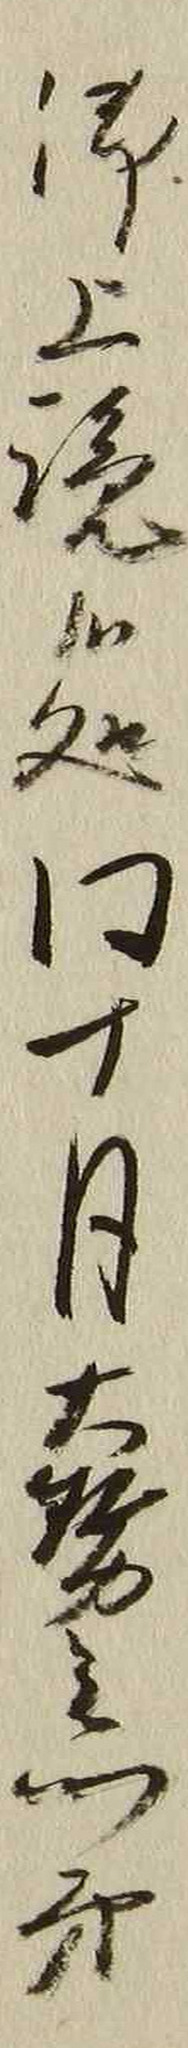御上覧候処同十月大勢之門弟
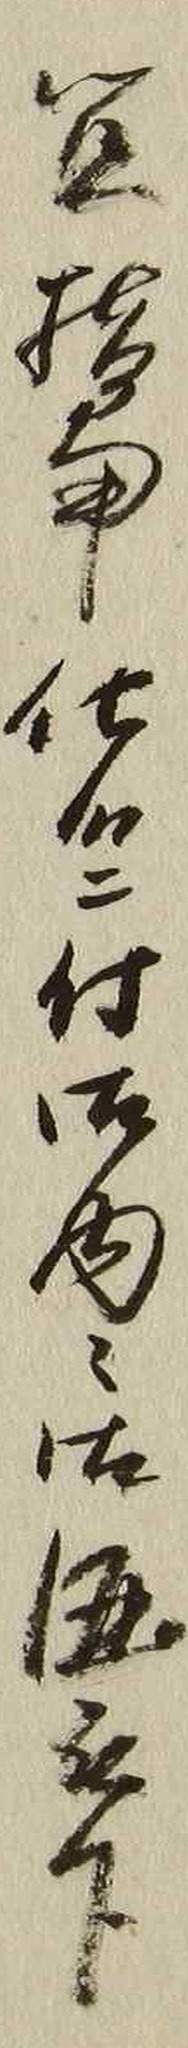宜指南仕候ニ付御内々御酒被下
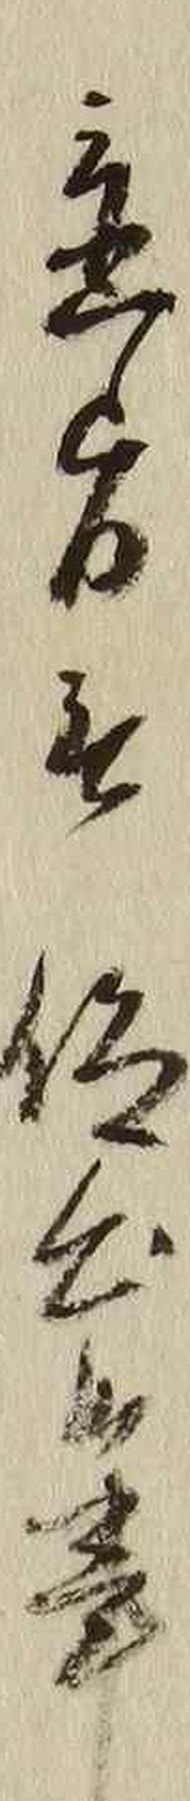置旨被仰出候事
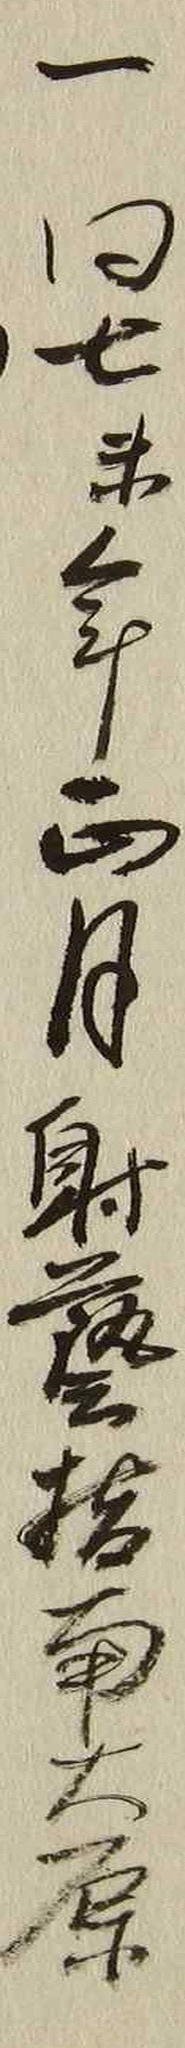一同七未年正月射芸指南大原
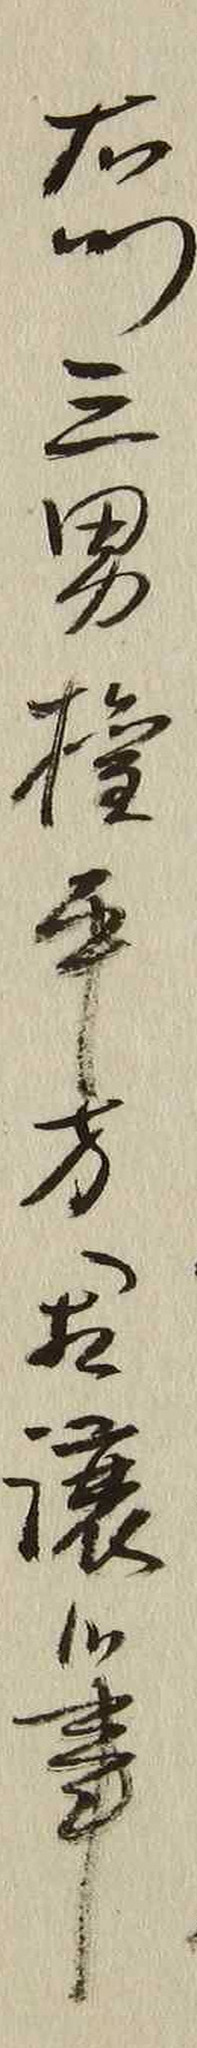右門三男権平方へ相譲候事
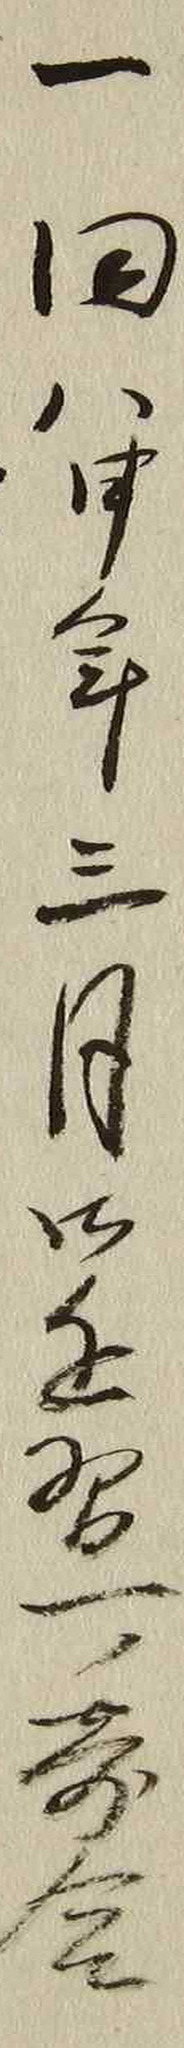一同八申年三月御近習一ノ寄合
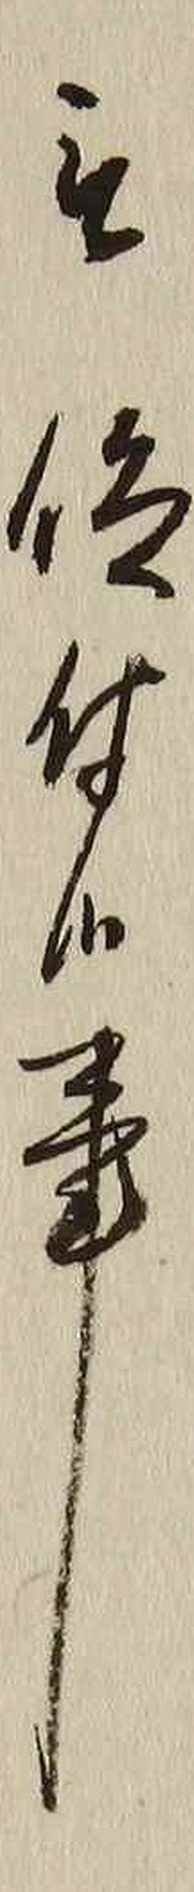被仰付候事
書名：諸士系譜　巻之346　も之部2
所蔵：会津若松市立会津図書館
